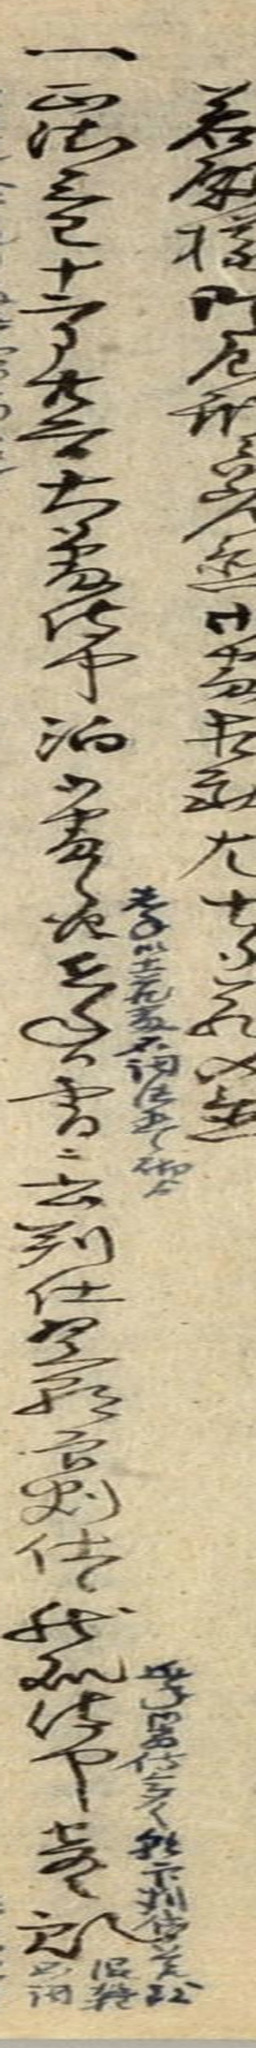一正徳三己十二月廿二日大御番侍中泊御番之儀近年は宵に書判仕翌朝印判仕候然処侍中寄々願
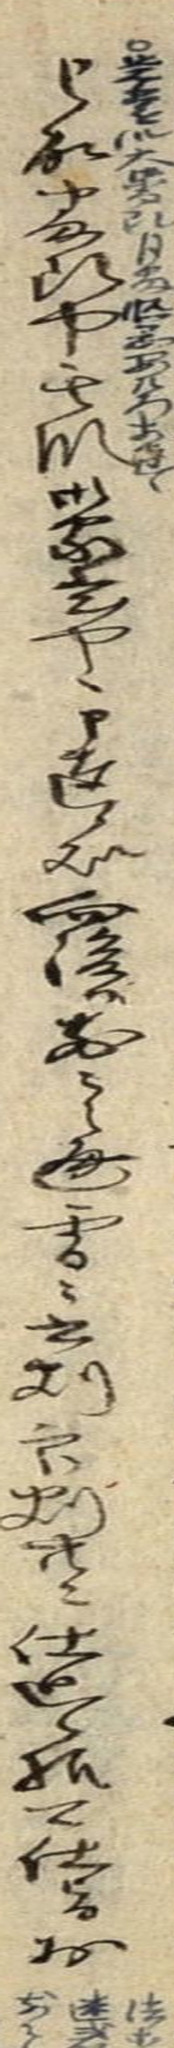申候処番頭中其段御家老中へ申達候処向後は前々之通宵に書判印判共に仕廻候様可仕旨於
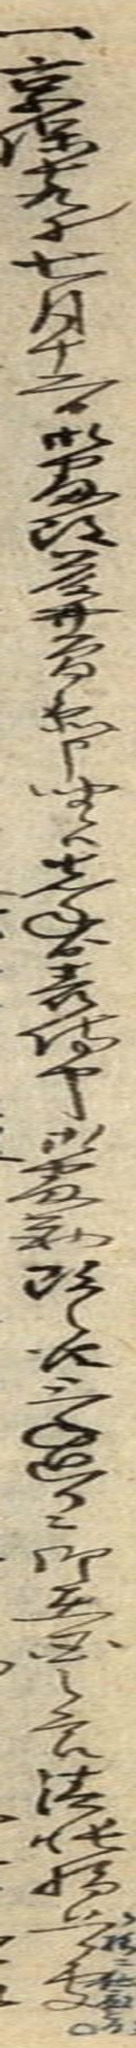一享保十九寅七月十二日御番改藤井曽兵衛申聞候は先年ゟ表侍中御番勤改之儀三年廻りに御在国之節請帳指上候処
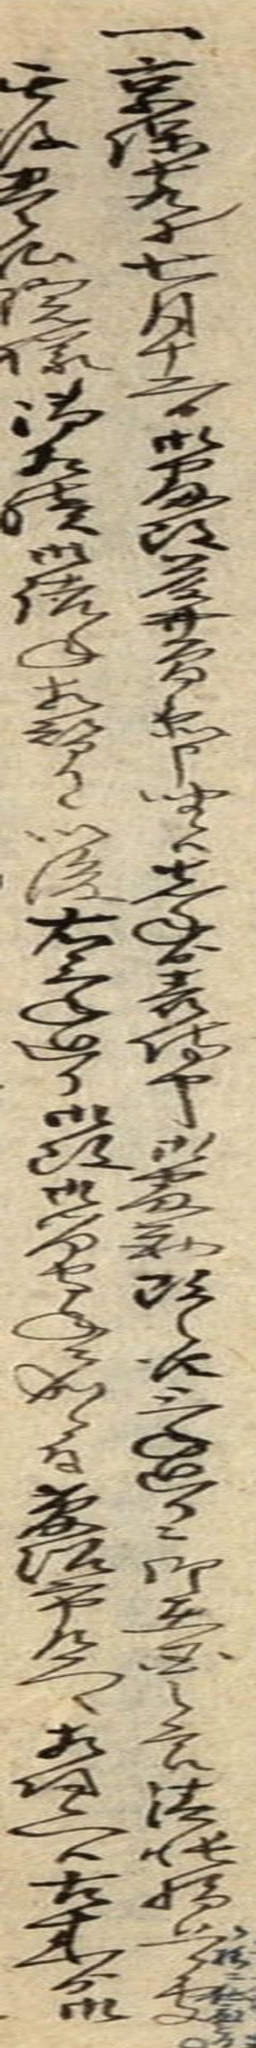其後豊仙院様御相続御詰年相替り候以後右三年廻り御改御留守年に成候に付菅沼市左衛門へ相伺候へは古来ゟ御
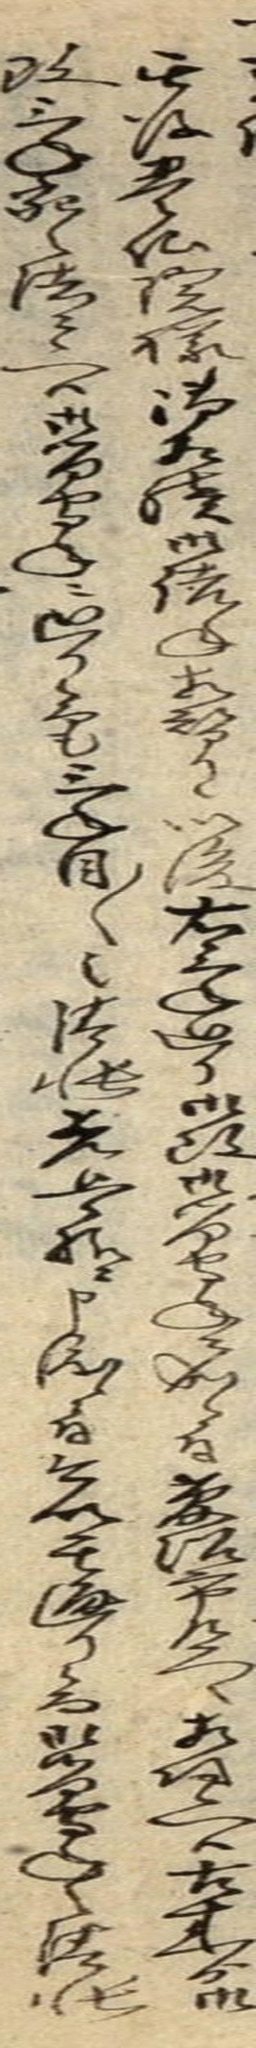改三年宛之法に候へは御留守年に廻り候而も三年目〳〵之請帳差上候様に申渡候に付今以其通りに候間御留守年之請帳
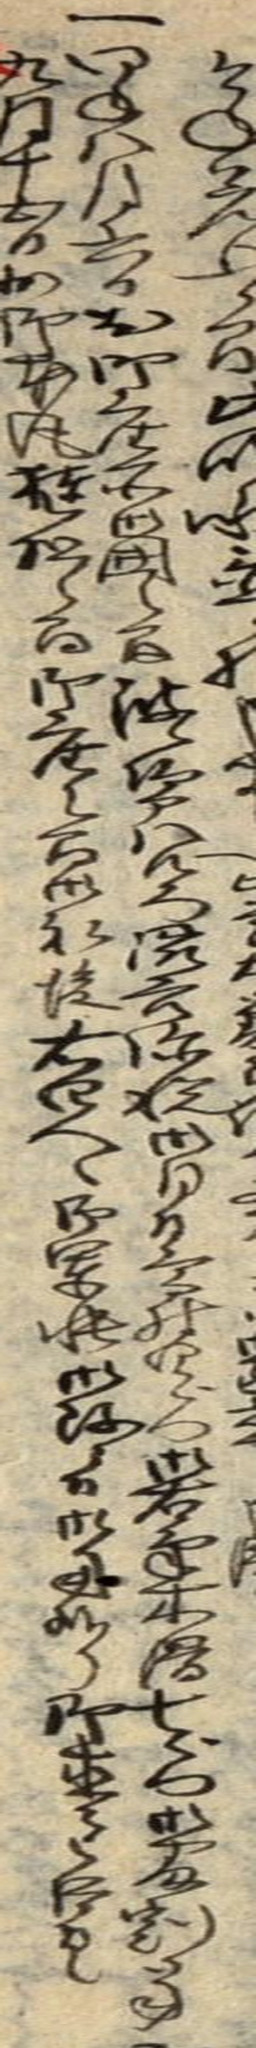九月十五日於御本丸韃靼之間御座之間御礼後右四人へ御軍帳御改に付御用掛り御直々被仰付候

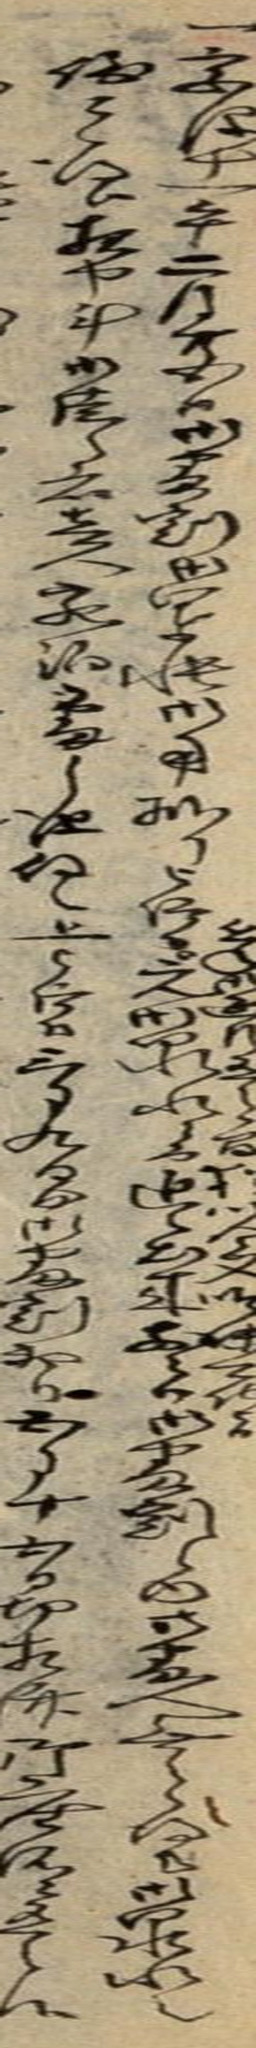儀に候得は夜中斗御徒之者壱人宛泊番之儀伺之上被仰付三月九日ゟ御番割初り五月十五日切相済御座所に有之候
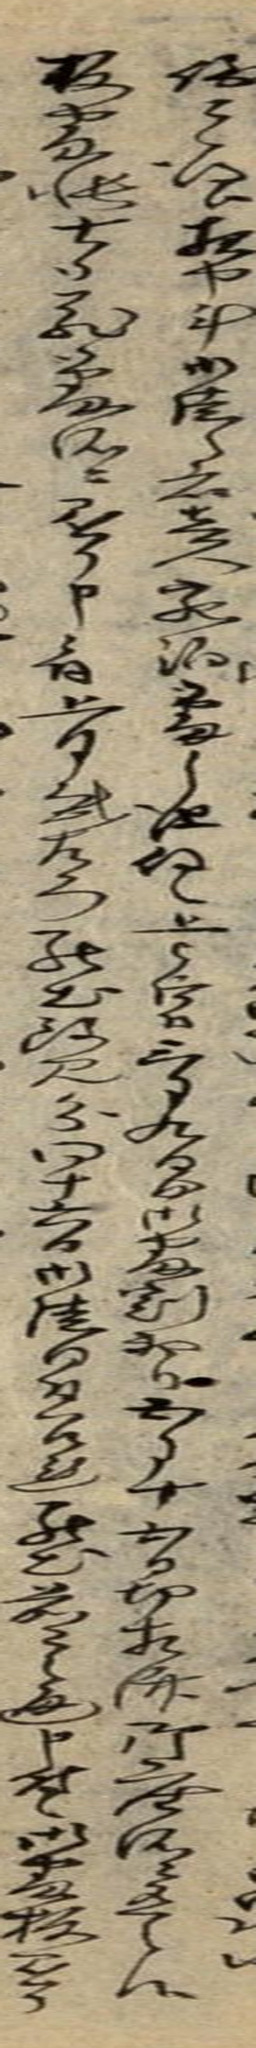板番帳七ッ蔵御番所に懸り申に付上月武左衛門罷出致見分同十六日御徒目付召連罷出前々之通申付候御番板懸り
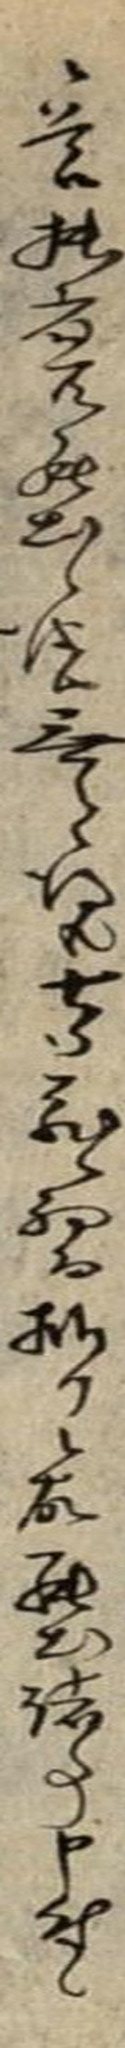候節拙者共罷出候儀は無之候得共七ッ蔵へ初而掛り候故罷出諸事申付候
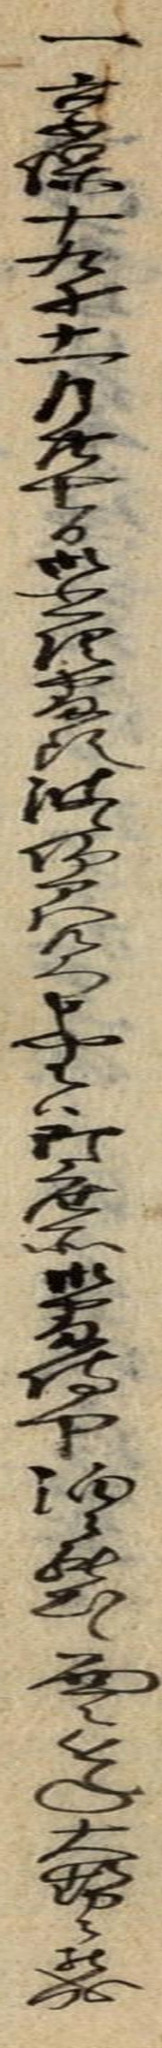一享保十九寅十一月廿七日御書院番頭波々伯部八左衛門申聞候は御座所御番侍中泊に罷出候面々近年大勢に罷成
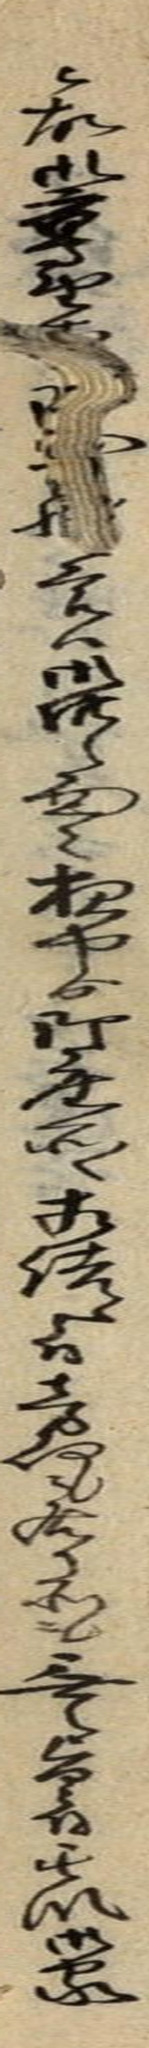候故御鷹野等節は御供之面々夜中ゟ御座所へ相詰候に付旁何も居り所も無之旨に付其段御家
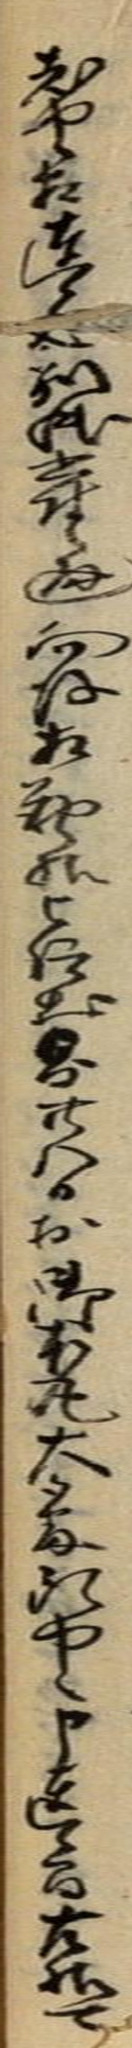老中へ相達候処別紙書付之通向後相勤候様被仰出即廿八日於御本丸大御番頭中へ申達候間左様可
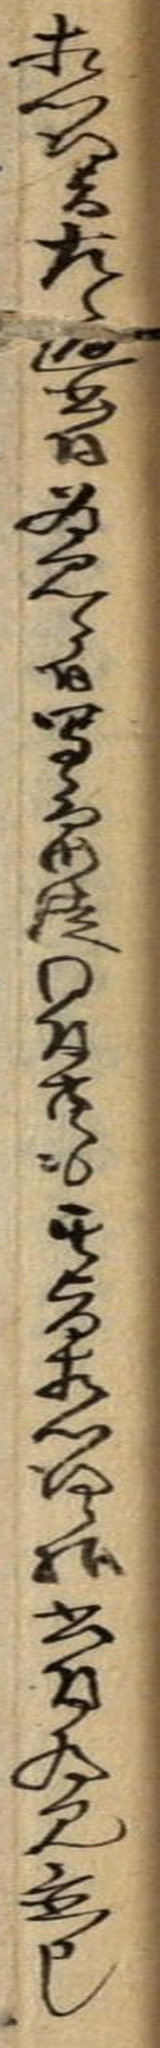相心得旨左之通書付為見候に付写に而御徒目付へも其旨相心得候様書付為見置申候
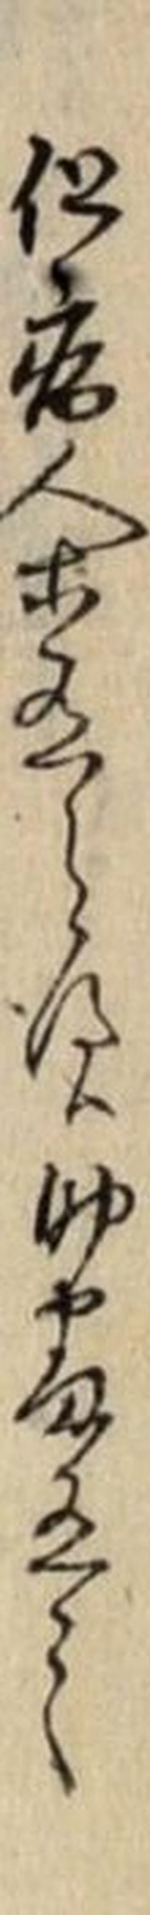但病人等有之候得は助番有之
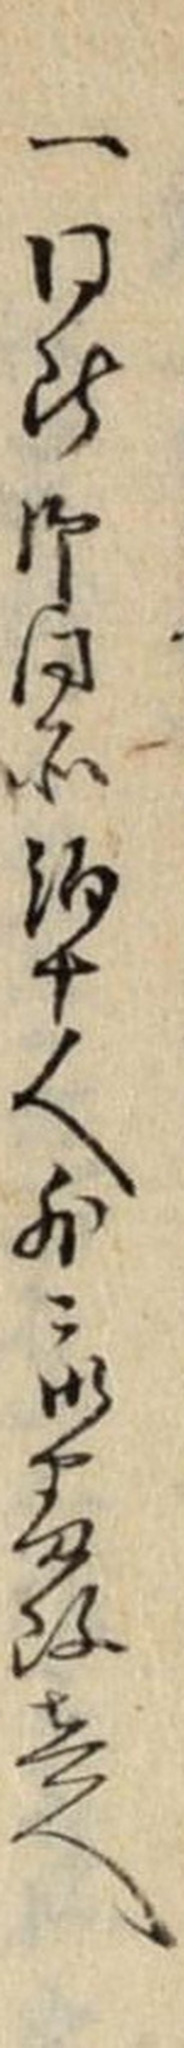一同断御同所泊十人外に御番改壱人
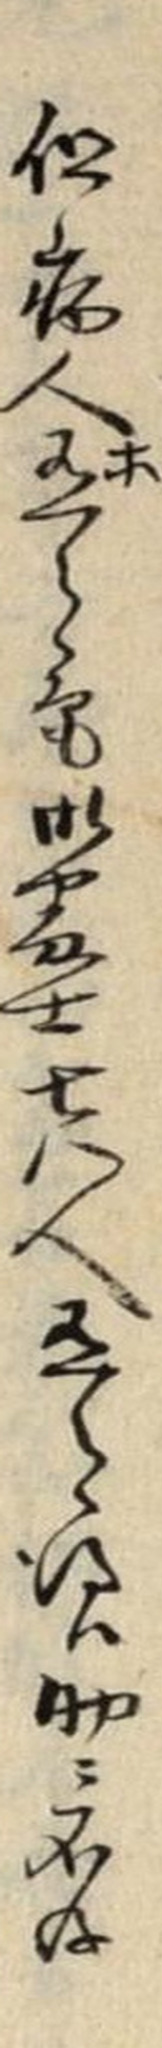但病人等有之候而も御番士七八人有之候得は助に不及
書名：蒐輯之部
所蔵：福井県文書館 Fukui Prefectural Archives
